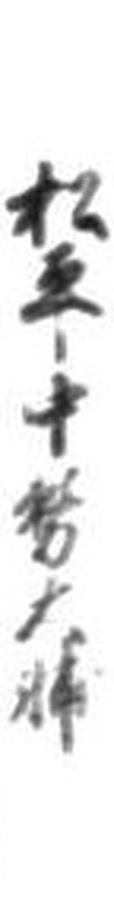松平中務大輔
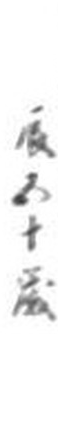辰五十歳
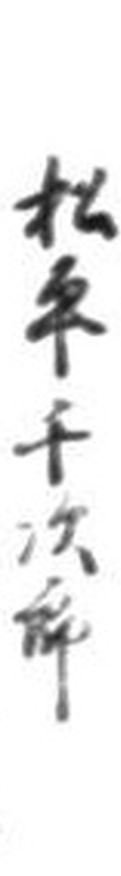松平千次郎

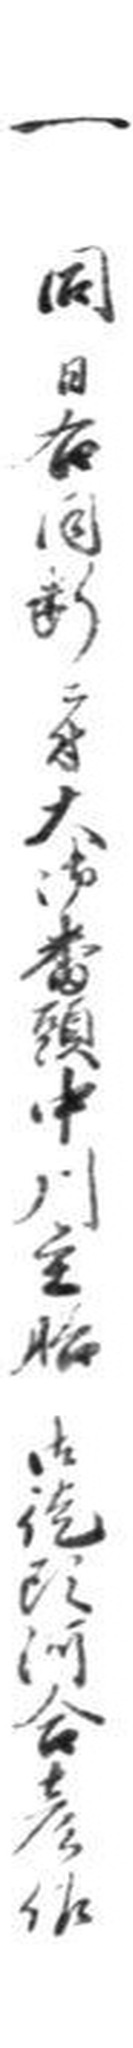一同日右同断ニ付大御番頭中川主膳御徒頭河合彦作
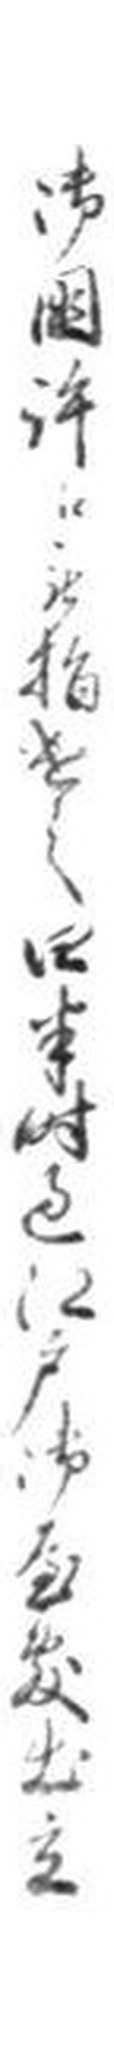御国許江被指遣之四半時過江戸御屋敷出立
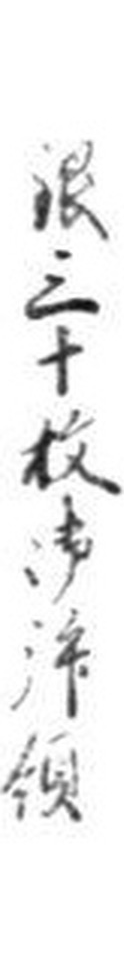銀三十枚御拝領
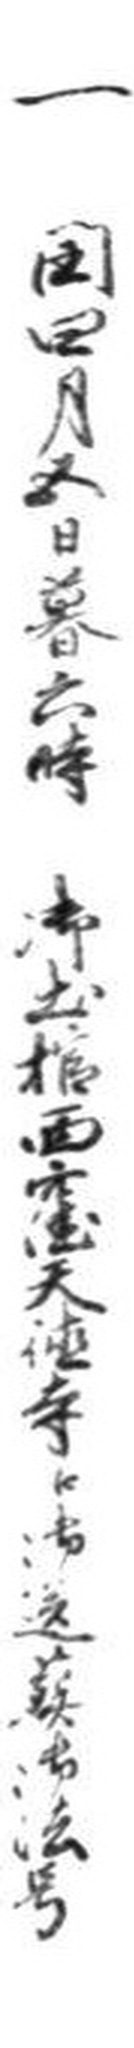一閏四月五日暮六時御出棺西窪天徳寺江御送葬御法号
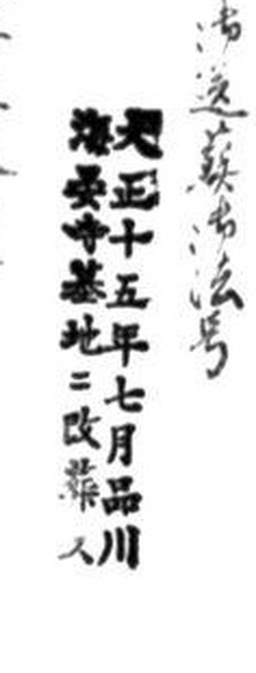大正十五年七月品川
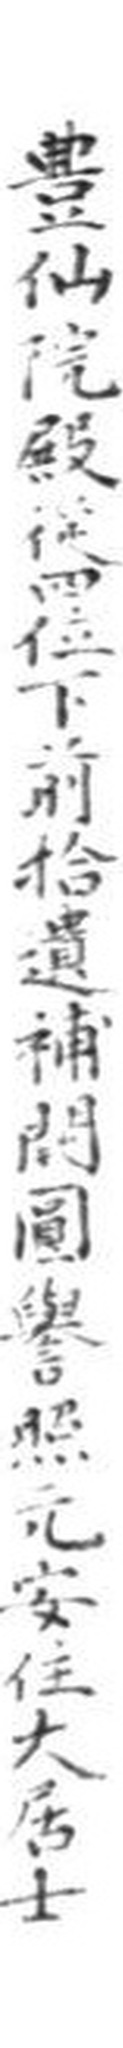豊仙院殿従四位下前拾遺補閥円誉照元安住大居士
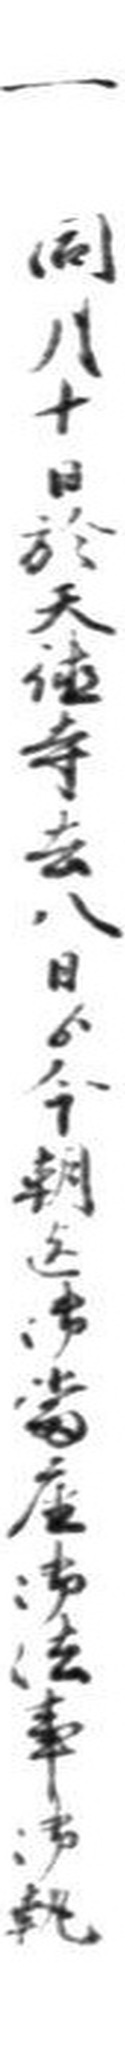一同月十日於天徳寺去八日ゟ今朝迄御当座御法事御執
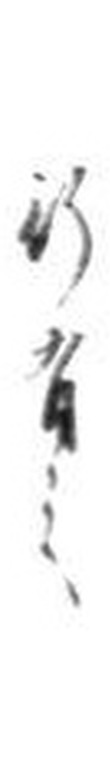行有之
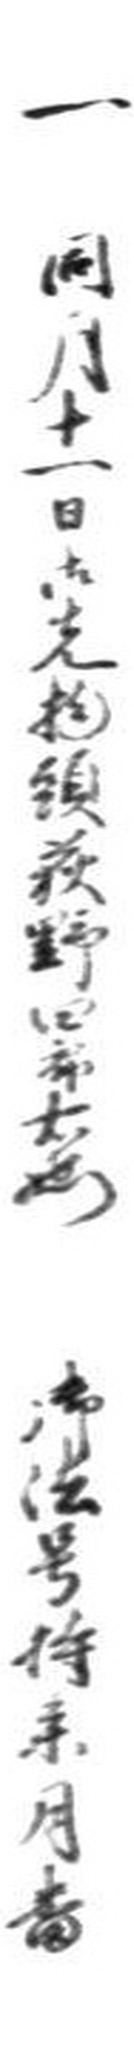一同月十一日御先物頭荻野四郎右衛門御法号持参月番
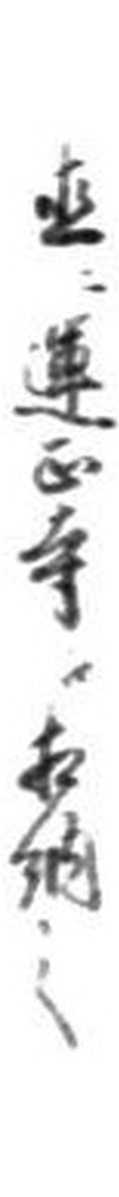直ニ運正寺江相納之
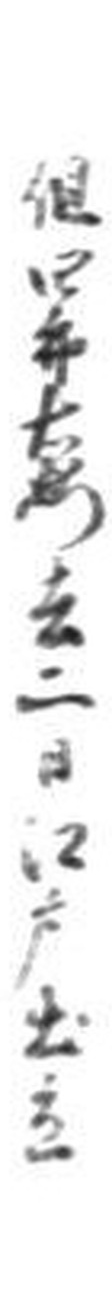但四郎右衛門去二日江戸出立
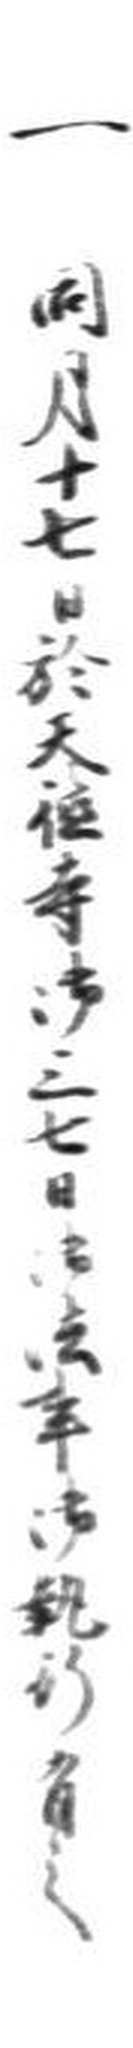一同月十七日於天徳寺御三七日御法事御執行有之
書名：家譜 三十六 宗昌公 従享保八年到同九年
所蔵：福井県文書館 Fukui Prefectural Archives
